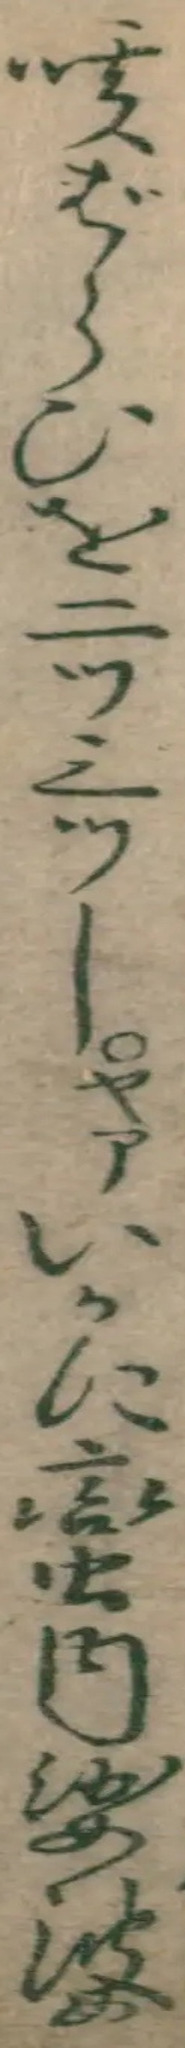咳ばらひを二ツ三ツし。ヤアいかに蛮内娑婆
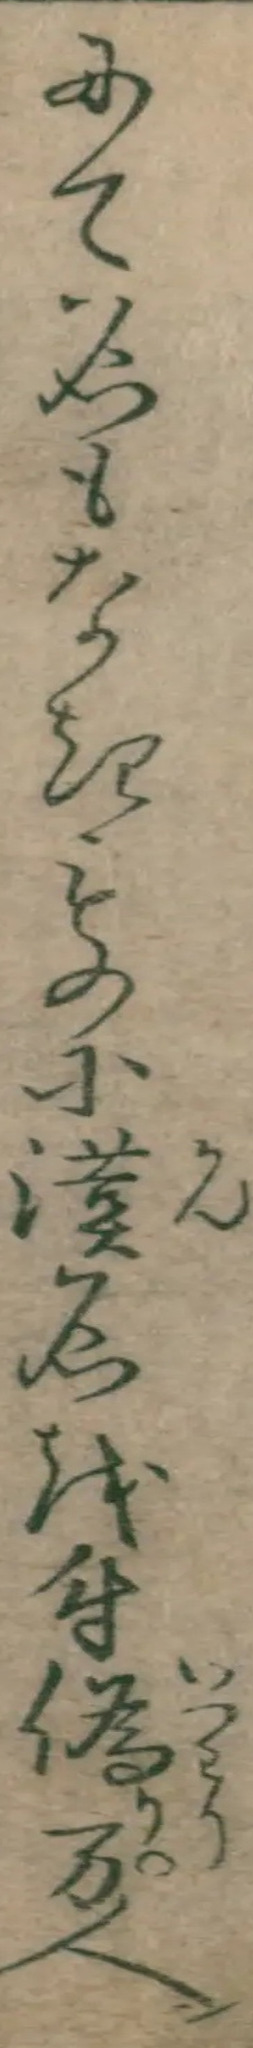にて名もなきものに漢名を付偽り。万人

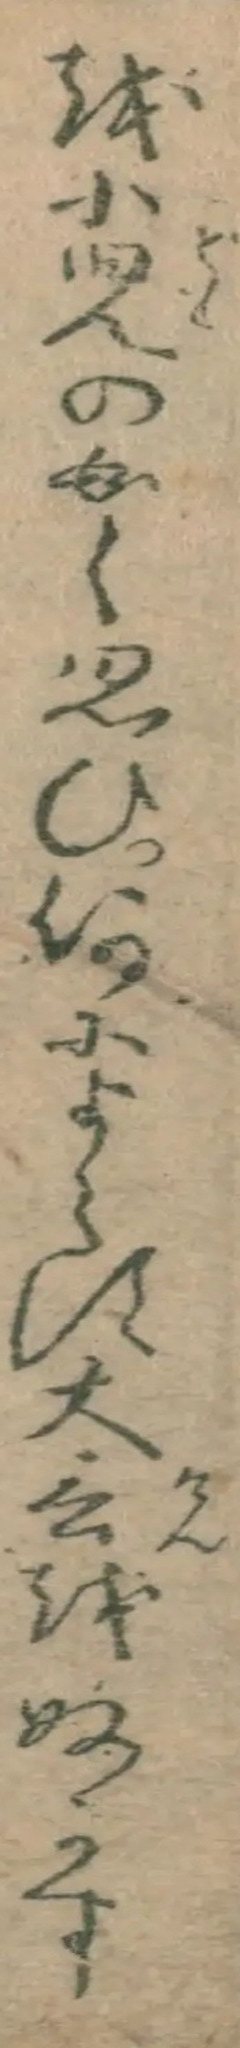を小児の如く思ひ。何によらす大言をぬかす
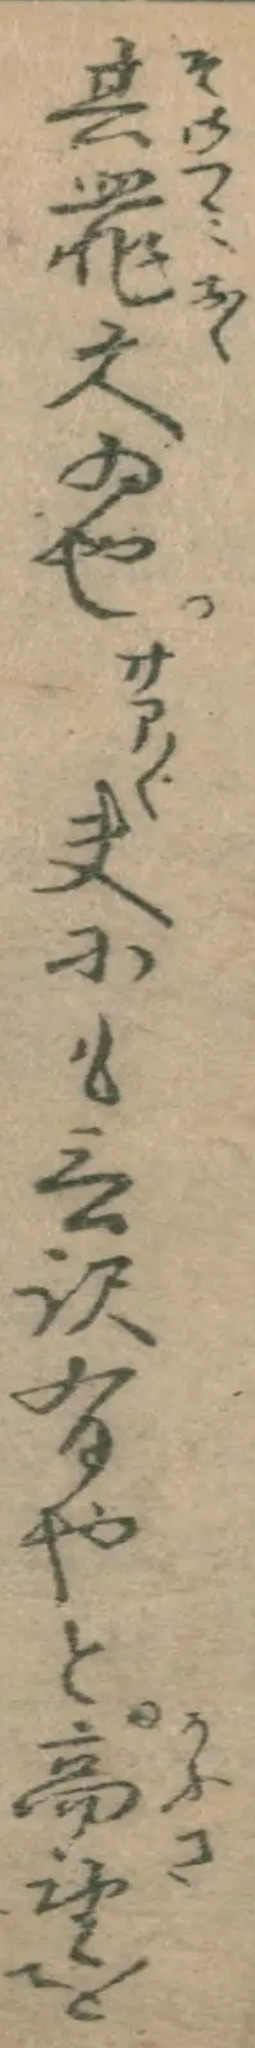其罪大ゐ也。サア〳〵夫にも言訳有也と。高坐を
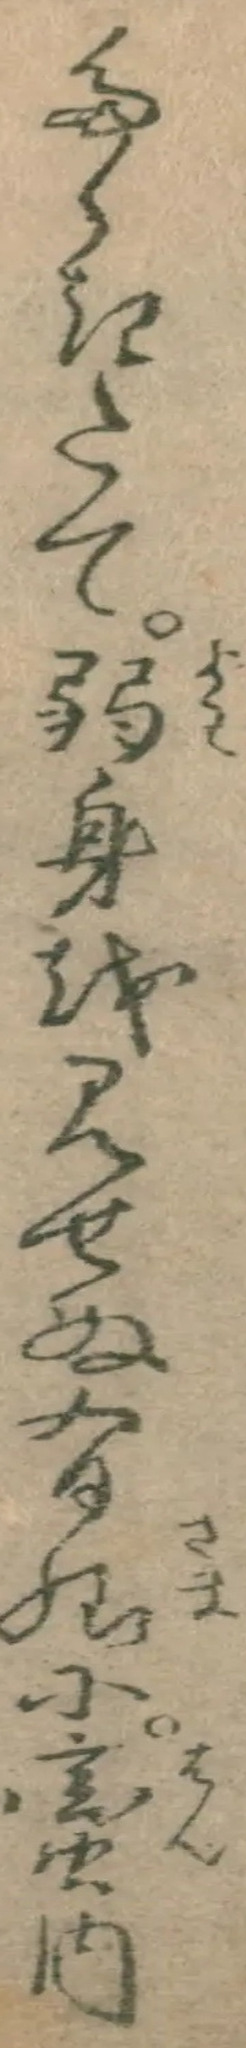たゝきたて。弱身を見せぬ有様に。蛮内
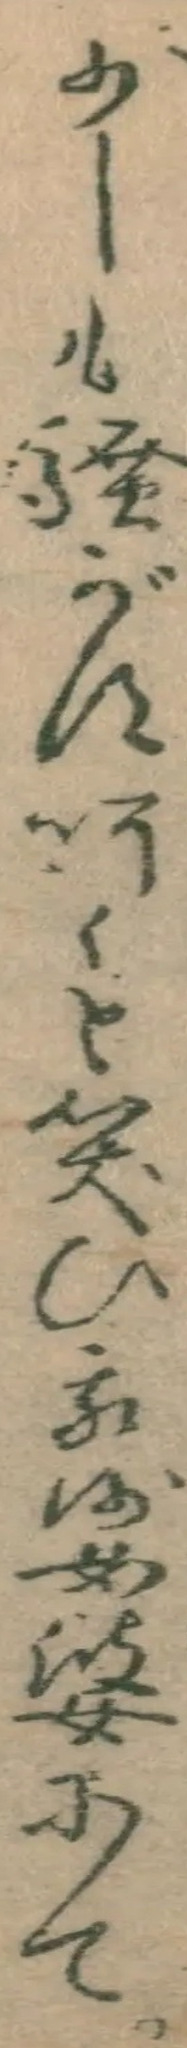少しも騒がす。呵〱と笑ひ我娑婆にて。
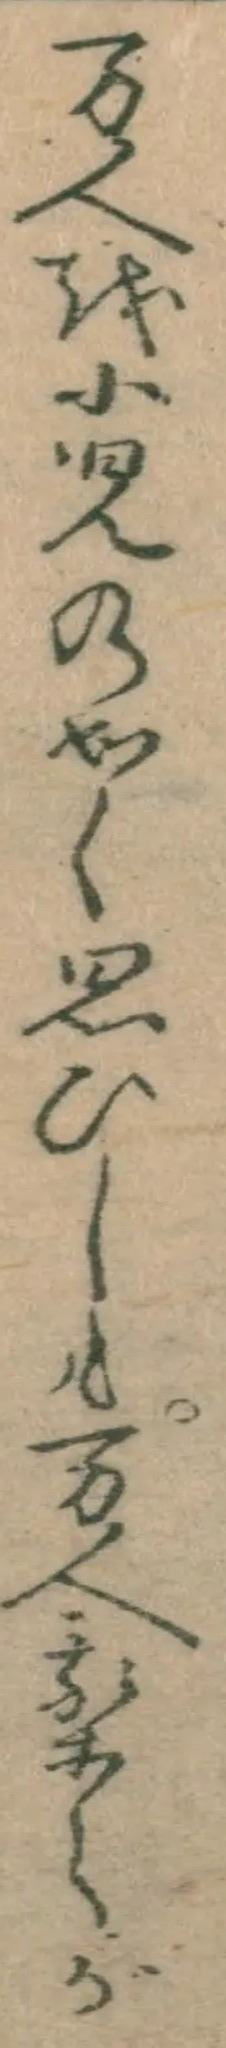万人を小児の如く思ひしも。万人我おらが
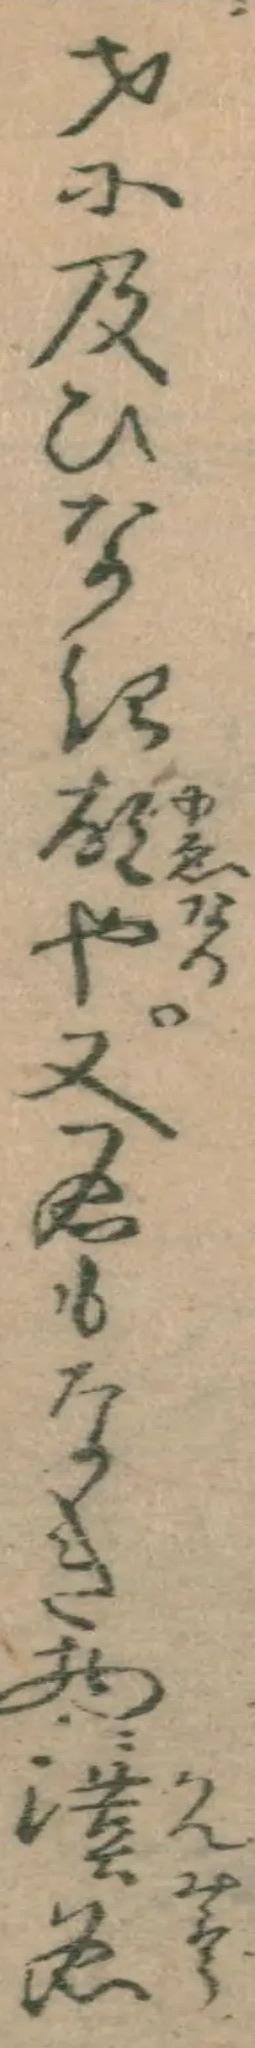才に及ひなき故也。又名もなき物漢名
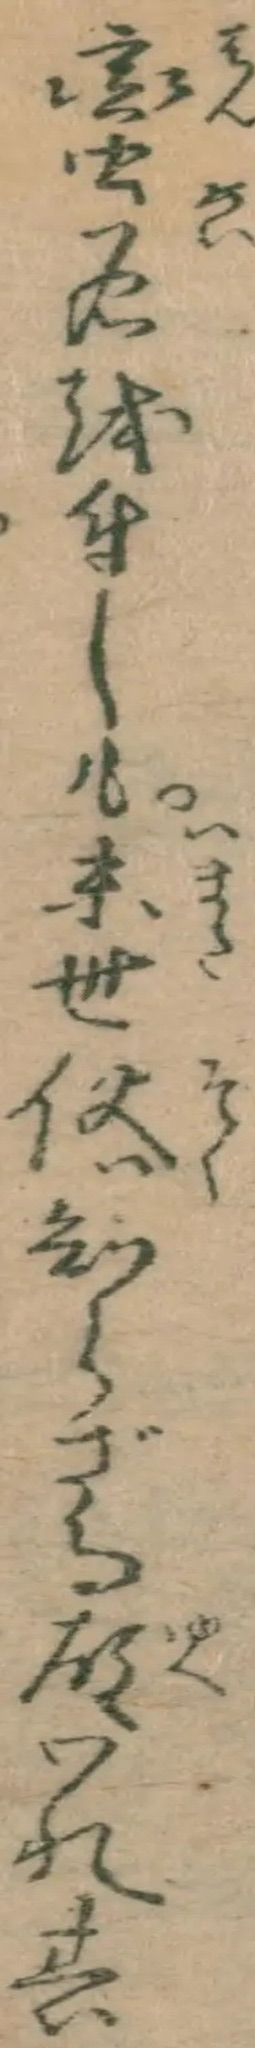蛮名を付しも。未世俗知らざる故われ其
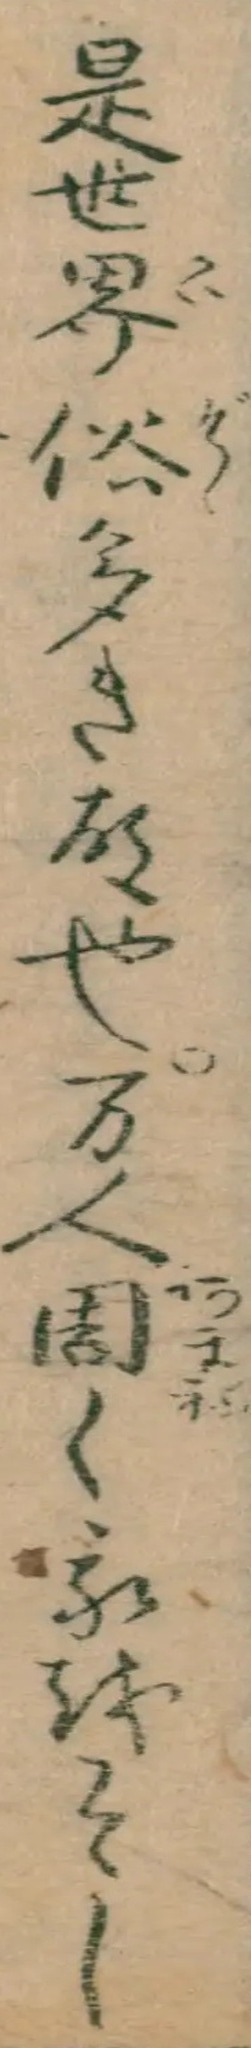是世界俗多き故也。万人周く我をそし
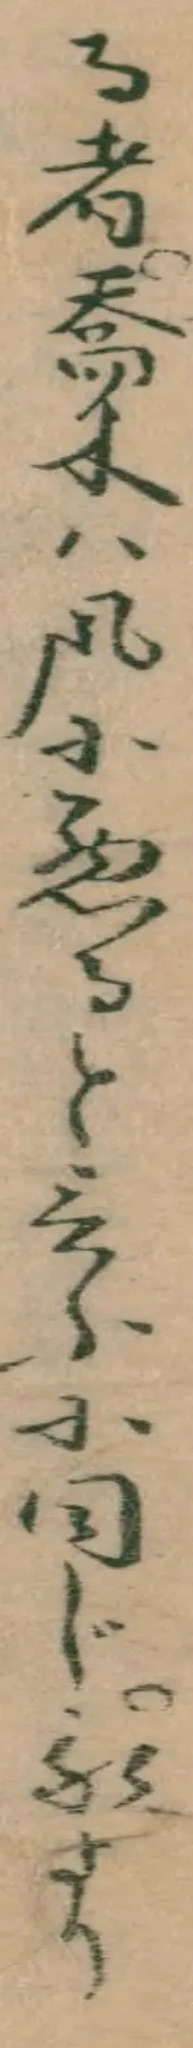る者。喬木は風に悪ると言ふに同じ。我より
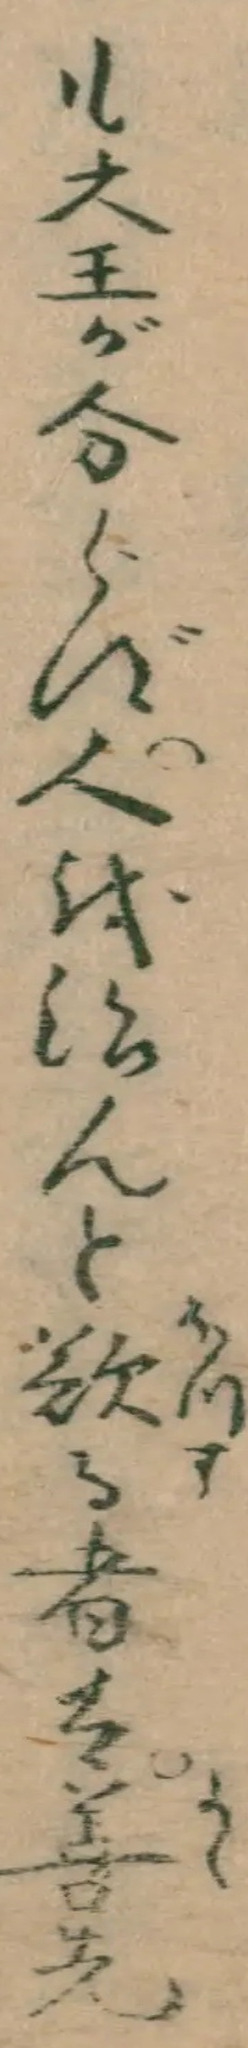も大王が分らず。人を治んと欲る者は。善先
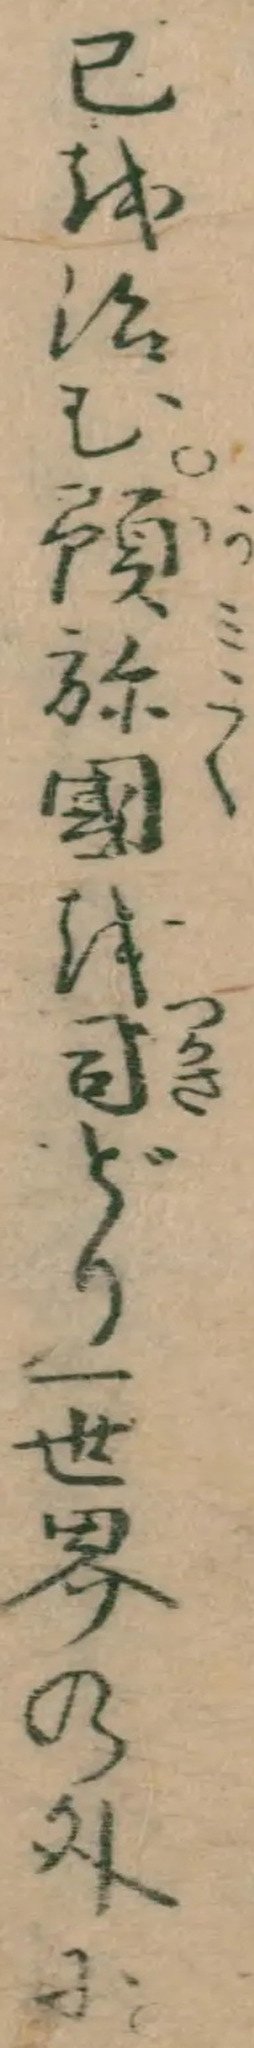己を治む。預弥国を司どり一世界の外に
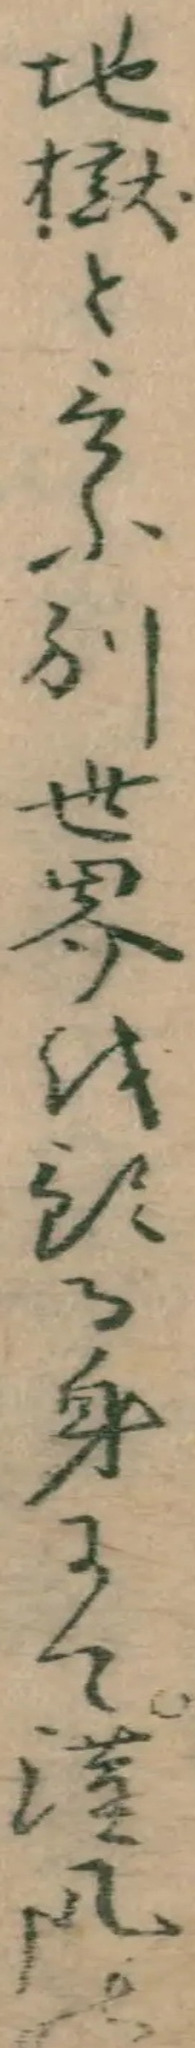地獄と言ふ別世界を預る身にて。漢風の
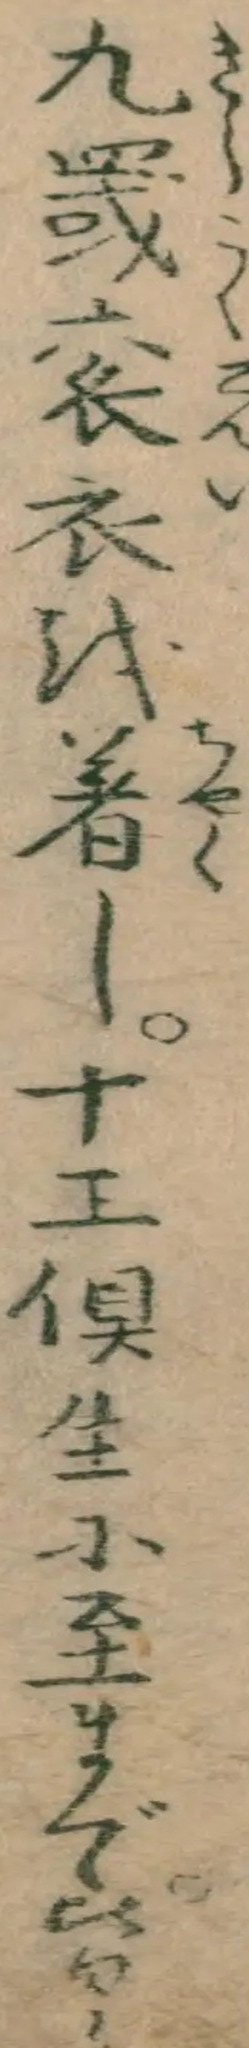九罭衮衣を着し。十王俱生に至まで。皆
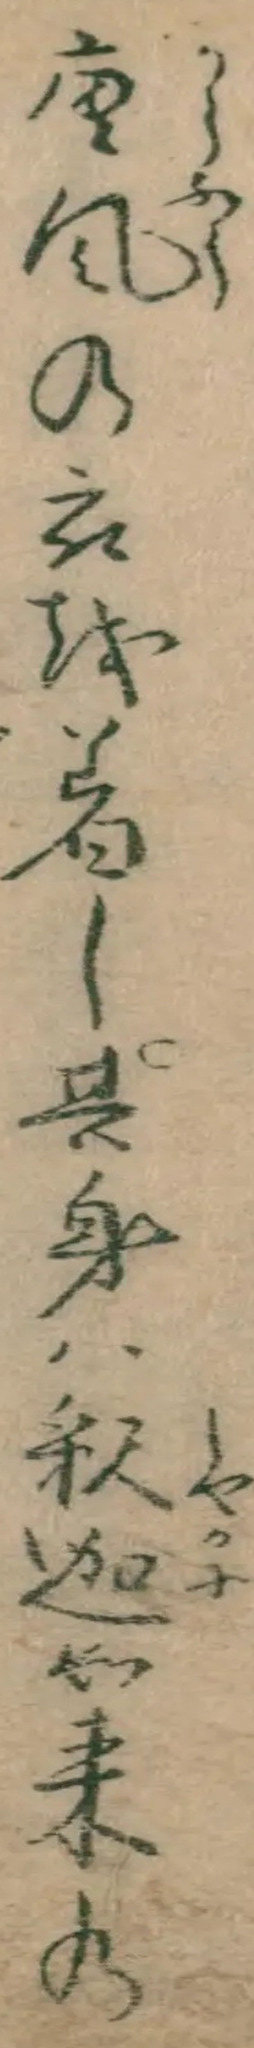唐風の衣を着し。其身は釈迦如来の
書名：翻草盲目
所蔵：国立国会図書館 National Diet Library, JAPAN
